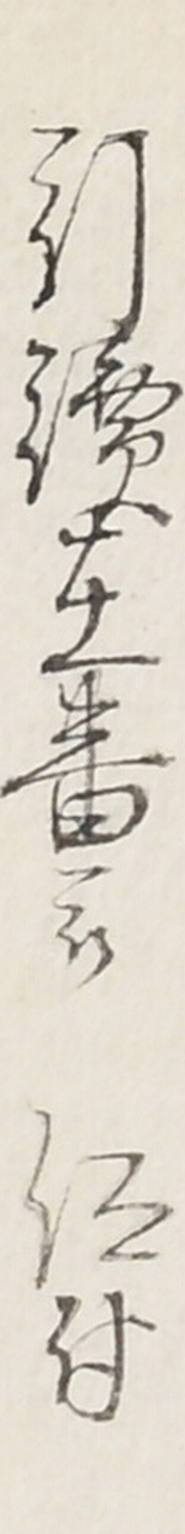引続在番被仰付
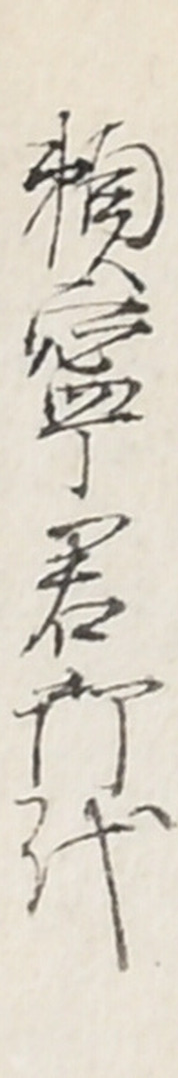頼寧君御代
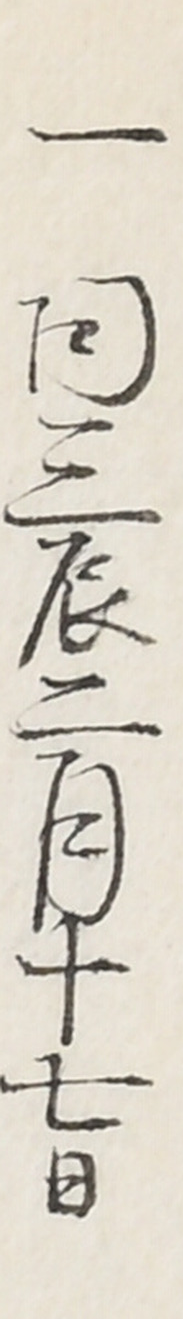一同三辰二月十七日
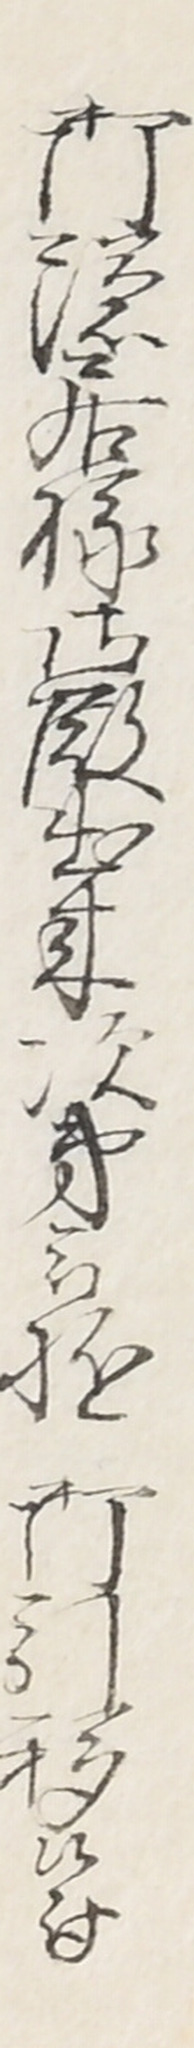御隠居様御殿出来次第被遊御引移候付
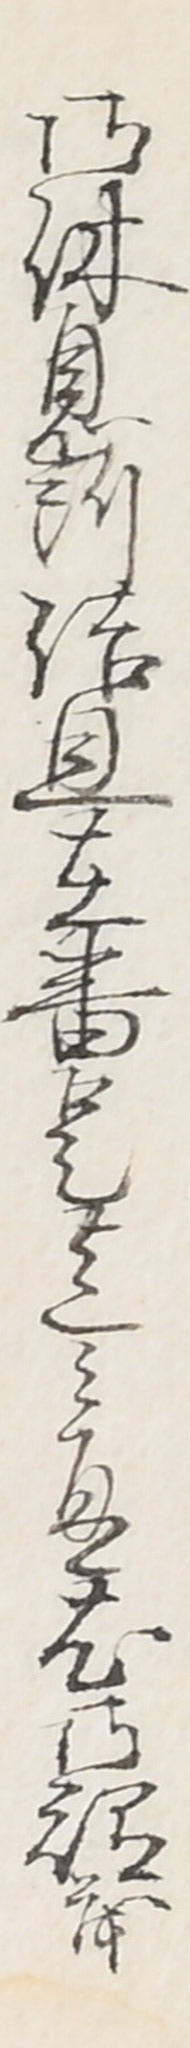御休息所詰且在番是迄之通尤御賄茂
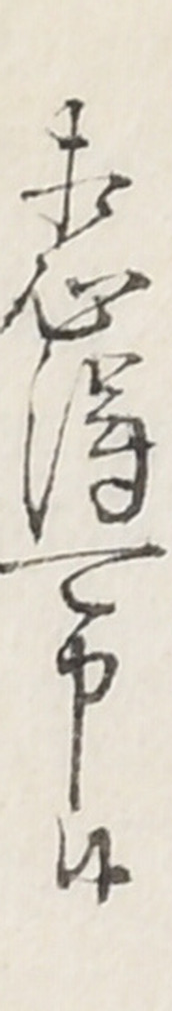相心得可申候
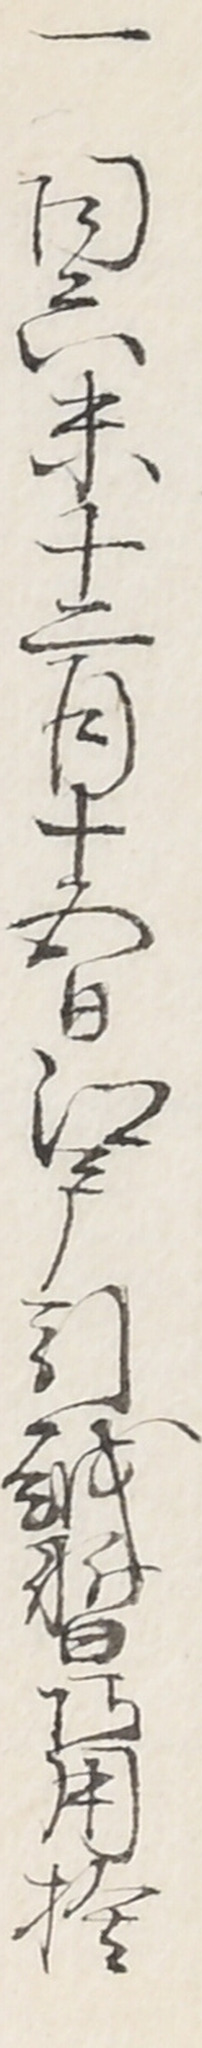一同六未十二月十五日江戸引越暫御用捨
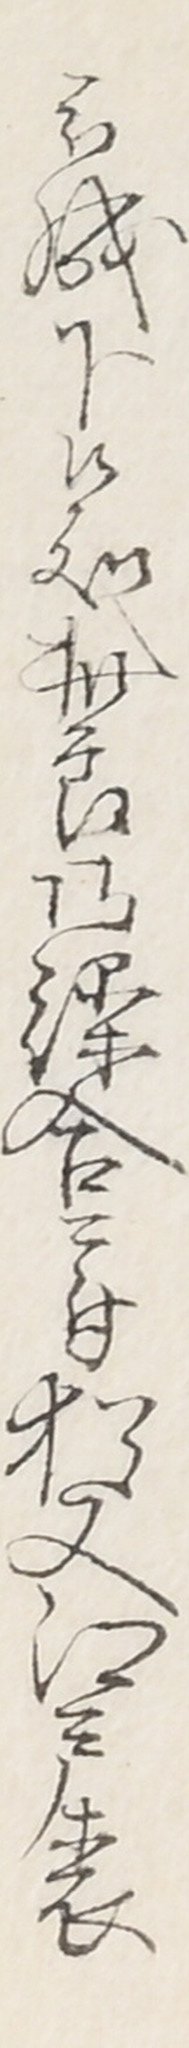被成下候処此節御繰合ニ付猶又江戸表
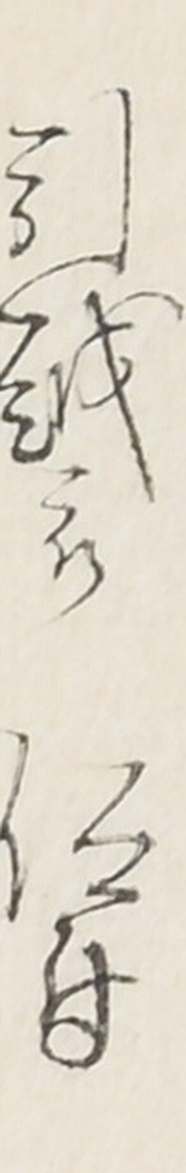引越被仰付
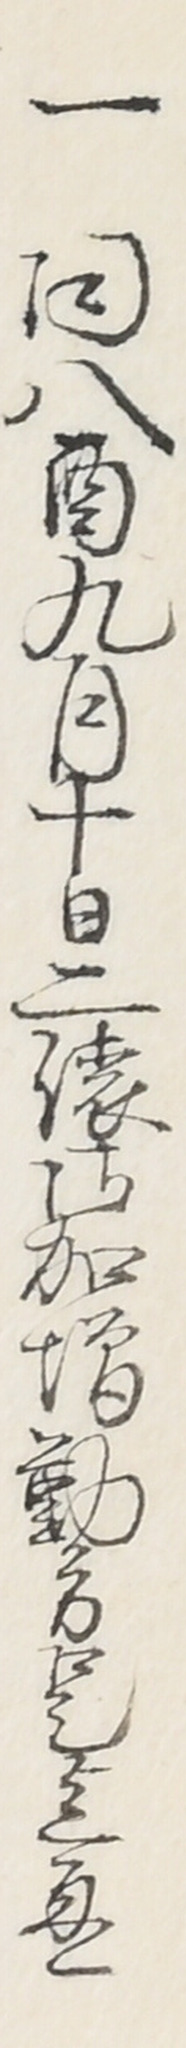一同八酉九月十日二俵御加増勤方是迄之通
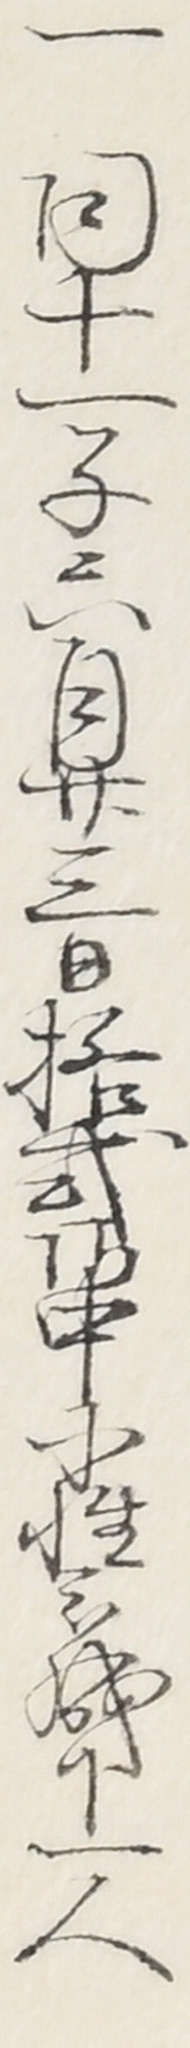一同十一子六月廿三日格式御中小性被成下一人
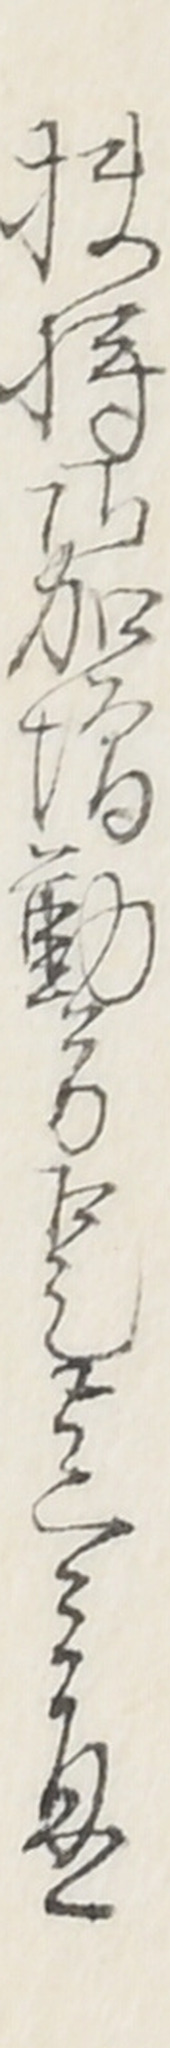扶持御加増勤方是迄之通
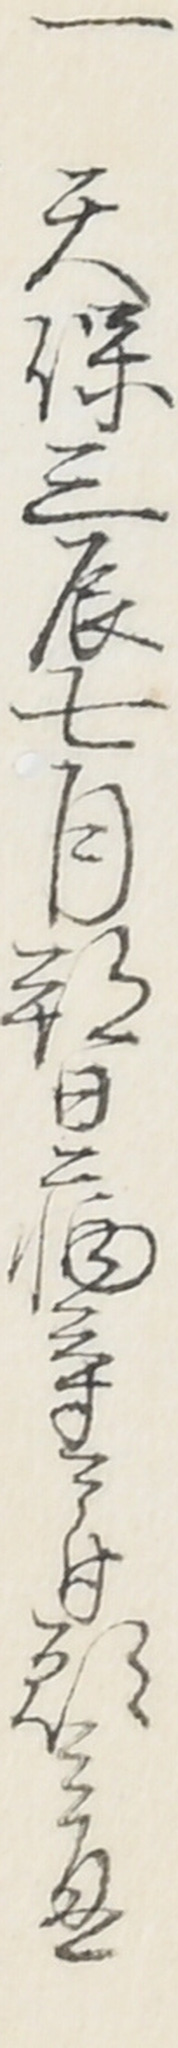一天保三辰七月朔日病気ニ付願之通
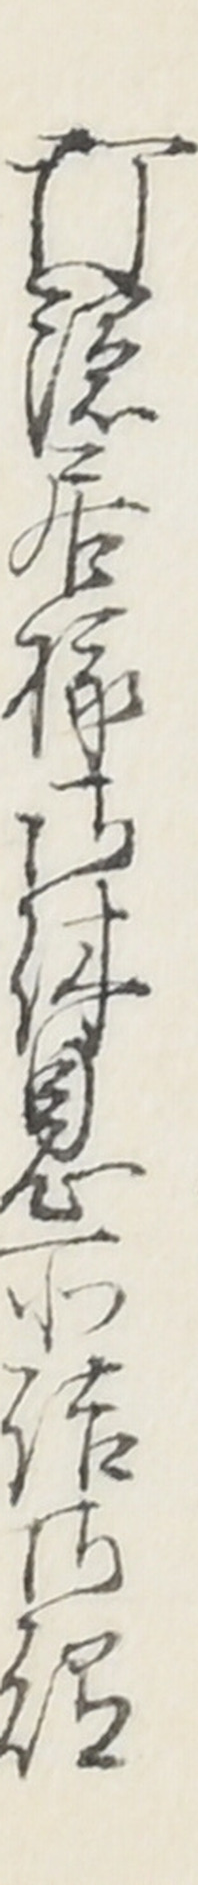御隠居様御休息所詰御賄
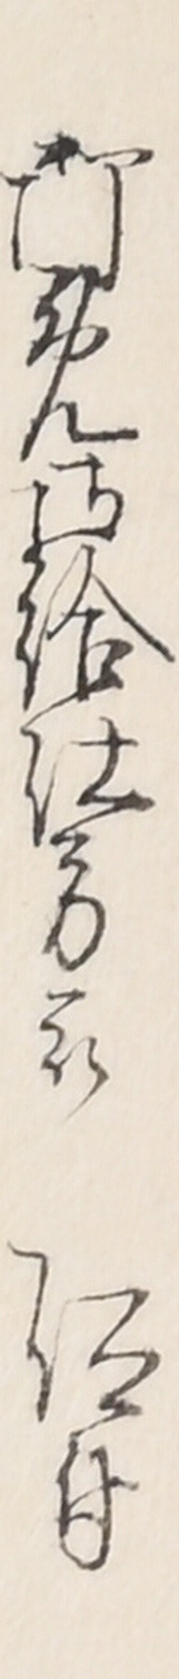御免御給仕方被仰付
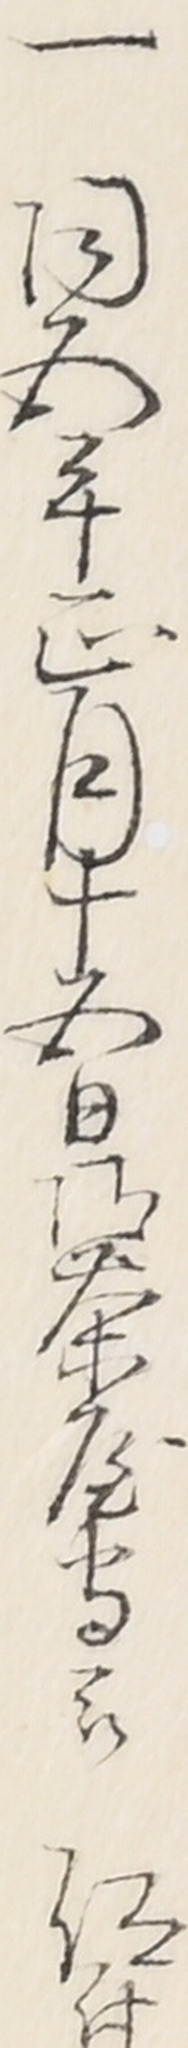一同五午正月十五日御茶屋守被仰付同所
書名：無足諸士勤仕録（四）
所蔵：伊那市立高遠町図書館・合同会社AMANE
